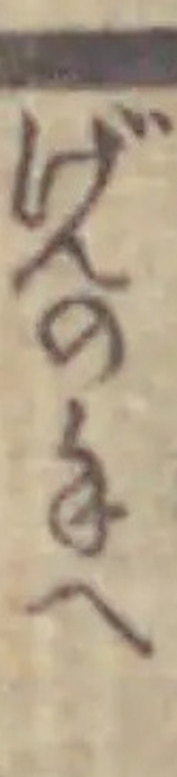げんの手へ
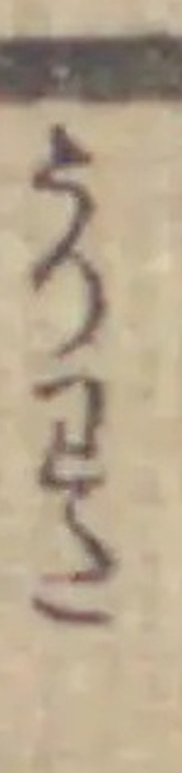うりわた
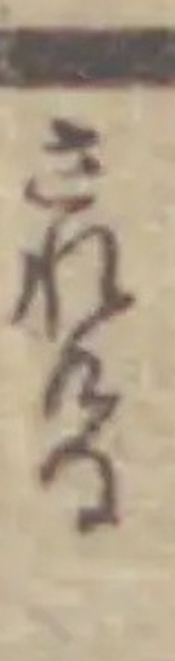されける
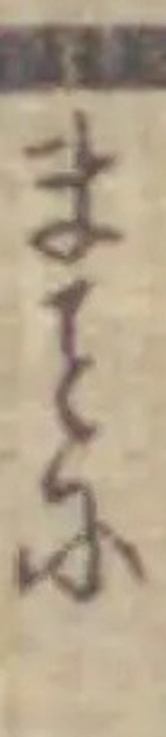まことに
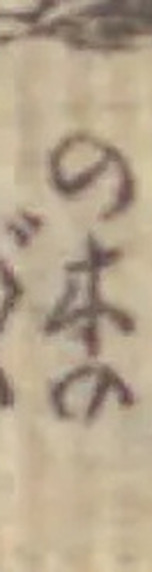の木の
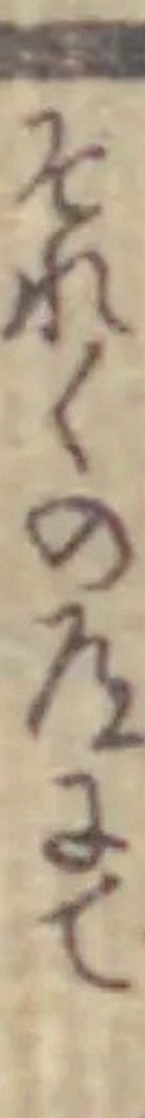それ〳〵の道にて
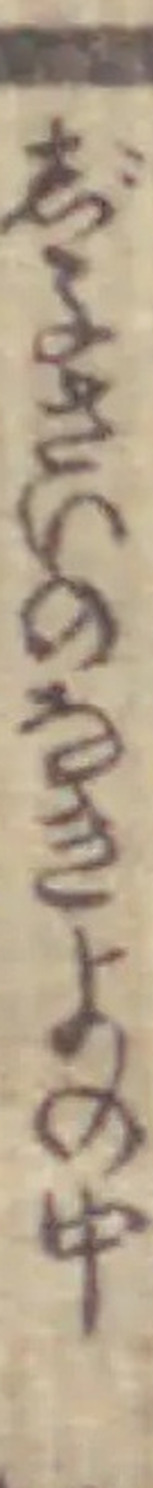じよさいのなきよの中
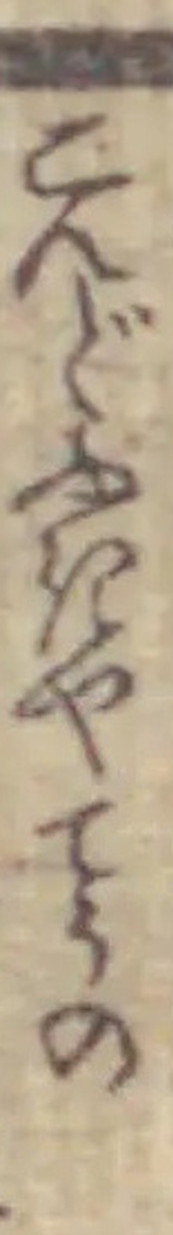こんどふきやてうの
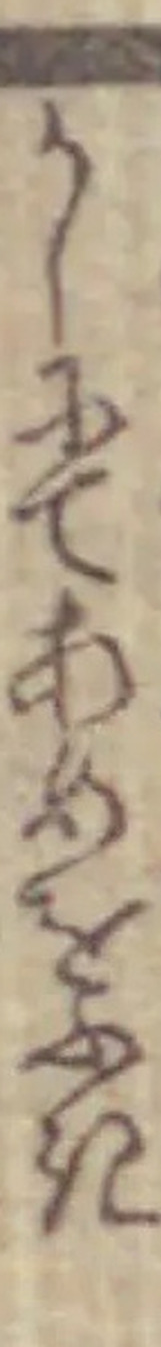かしにてあめをふき
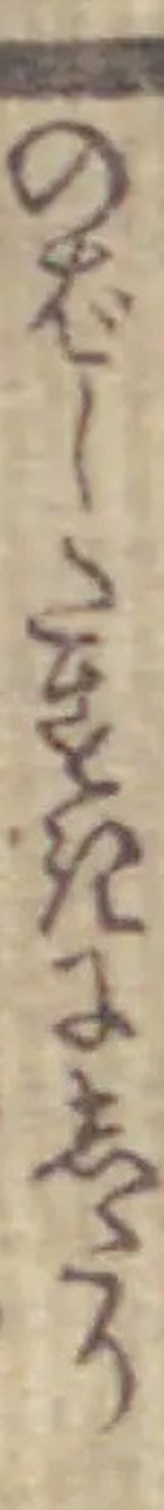のばしたすきにしたり
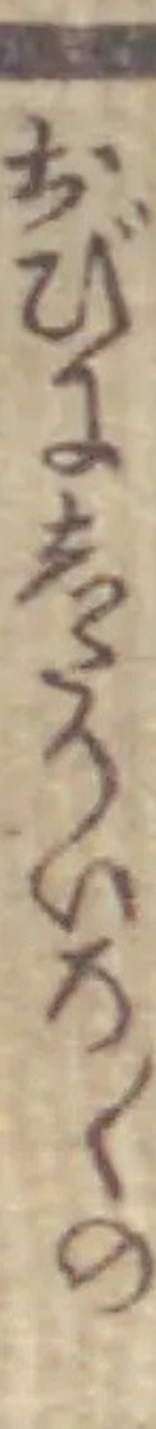おびにしたりいろ〳〵の
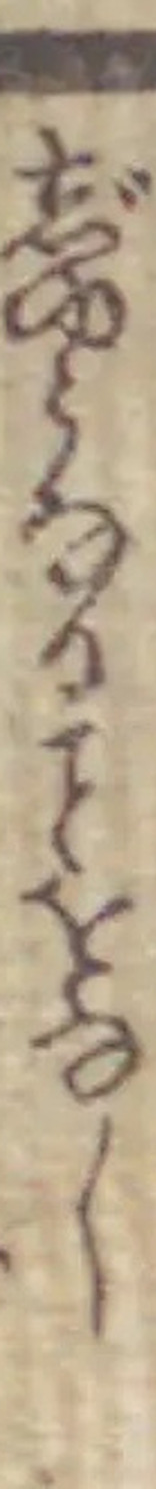じゆうなることをなし
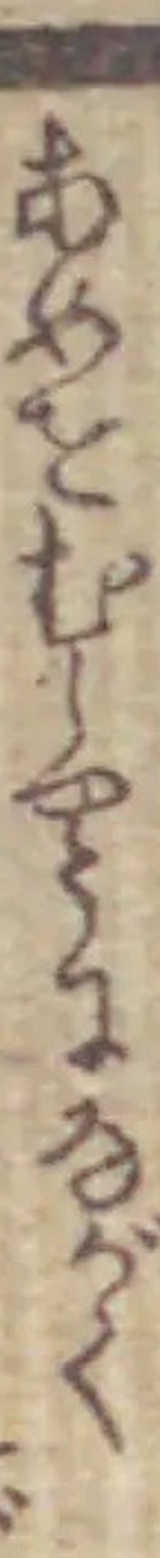あめをむしやうにながく
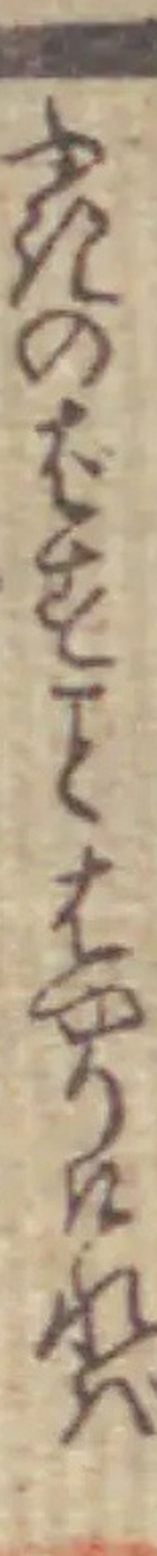ふきのばすことはやりにければ
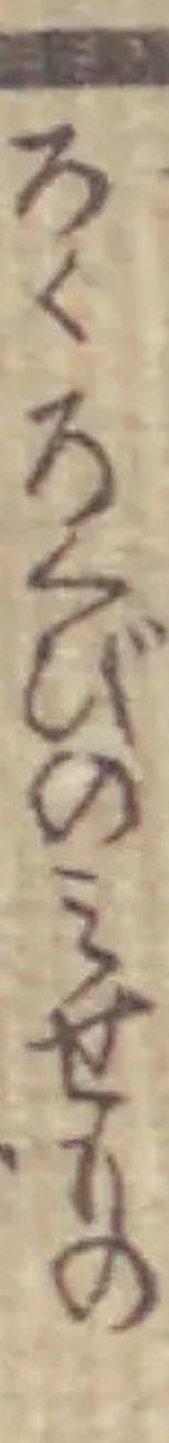ろくろくびのみせもの
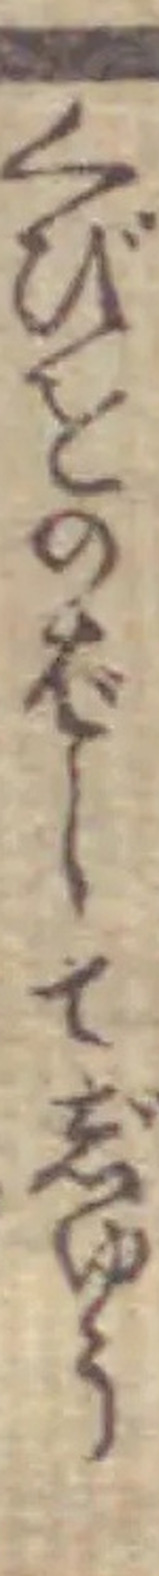くびをのばしてじゆう
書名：化物敵討 2巻
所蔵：国立国会図書館 National Diet Library, JAPAN
